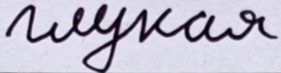глухая
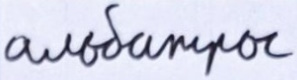альбатрос
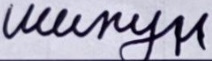шипун
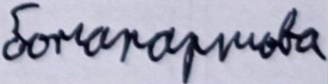бонапартова
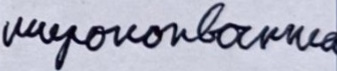широкохвостка
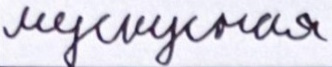мускусная
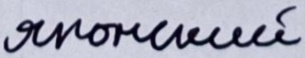японский
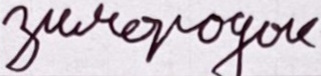зимородок
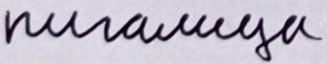пигалица
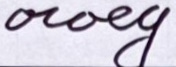осоед
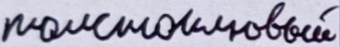толстоклювый
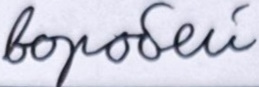воробей
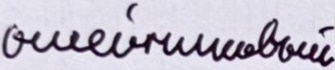ошейниковый
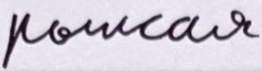рыжая
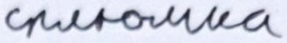сплюшка
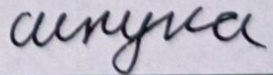сипуха
